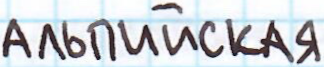альпийская
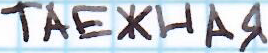таежная
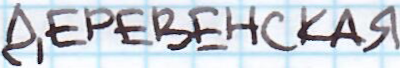деревенская
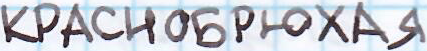краснобрюхая
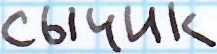сычик
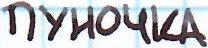пуночка
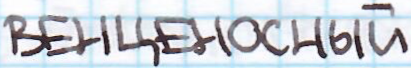венценосный
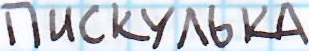пискулька
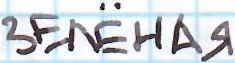зелёная
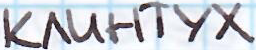клинтух
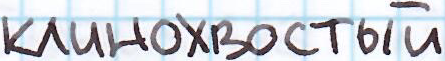клинохвостый
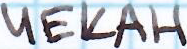чекан
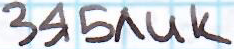зяблик
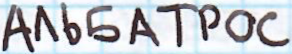альбатрос
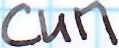сип
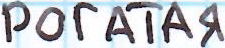рогатая
